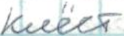клёст
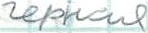черная
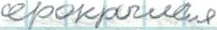серокрылая
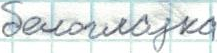белоглазка
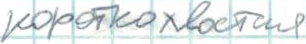короткохвостая
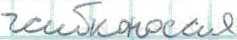чайконосая
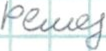ремез
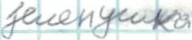зеленушка
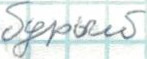бурый
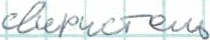свиристель
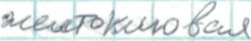желтоклювая
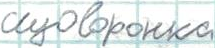сизоворонка
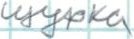щурка
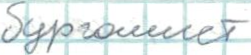бургомист
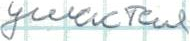ушастая
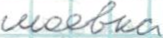моевка
